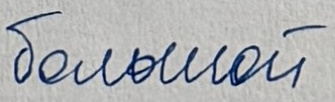большой
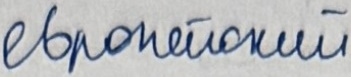европейский
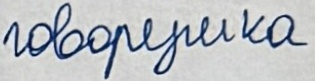говорушка
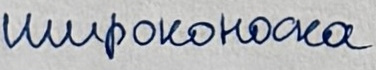широконоска
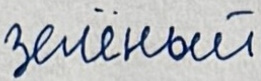зелёный
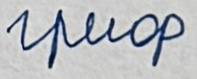гриф
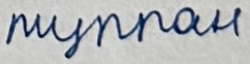туппан
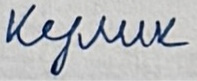кулик
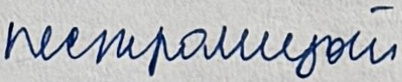пестролицый
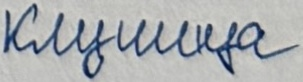клушица
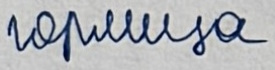горлица
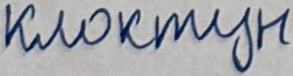клоктун
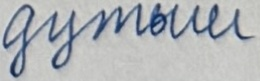дутыш
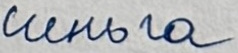синьга
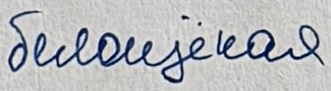белощёкая
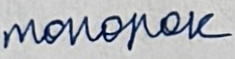топопок
